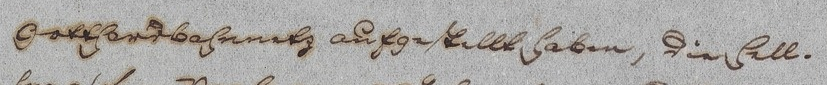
Gotthardbahnnetz aufgestellt haben, die Hell-
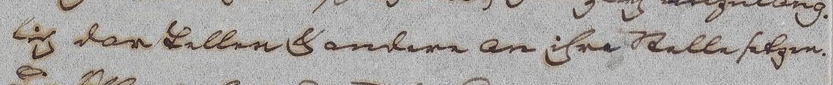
lich darstellen & andere an ihre Stelle setzen.
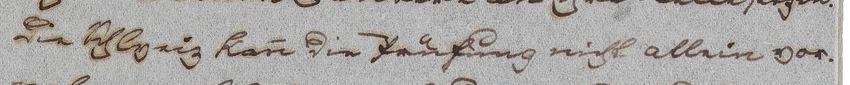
Die Schweiz kann die Prüfung nicht allein vor-
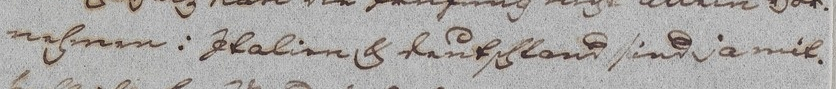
nehmen: Italien & Deutschland sind ja mit-
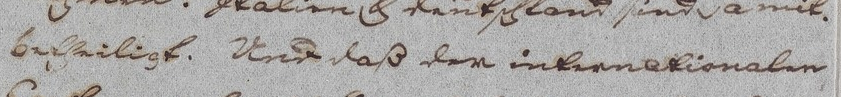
betheiligt. Und daß der internationalen
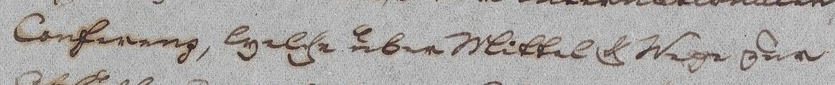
Conferenz, welche über Mittel & Wege zur
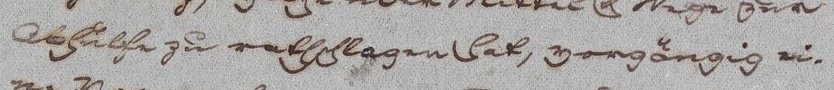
Abhülfe zu rathschlagen hat, vorgängig ei-
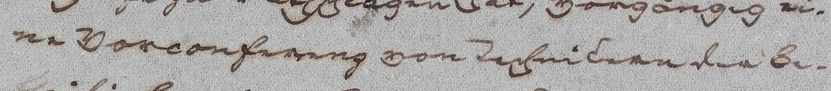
ne Vorconferenz von Technikern der be-
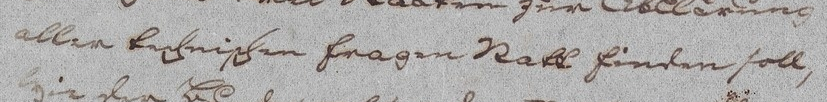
aller technischen Fragen Statt finden soll,
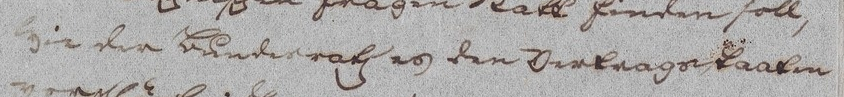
wie der Bundesrath es den Vertragsstaaten
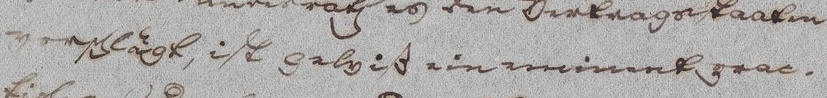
vorschlägt, ist gewiß ein eminent prac-
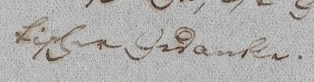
tischer Gedanke.
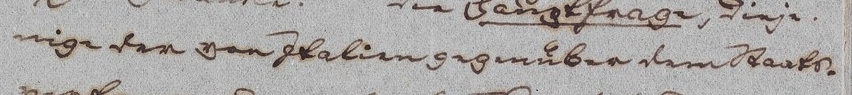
nige der von Italien gegenüber dem Staats-
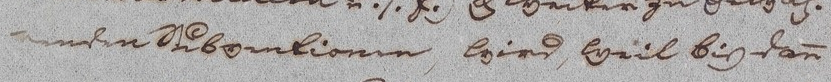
renden Subventionen, wird, weil bis dann
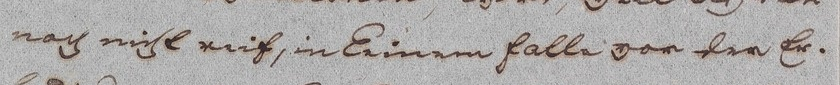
noch nicht reif, in keinem Falle vor der Er-
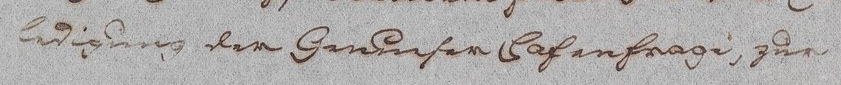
ledigung der Genueser Hafenfrage, zur
